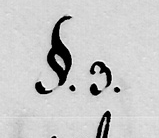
§.3.
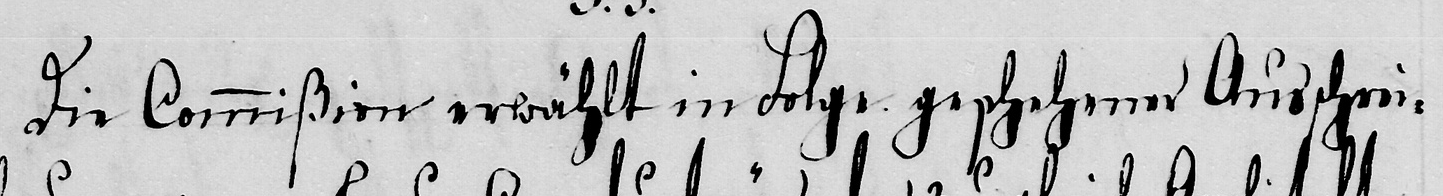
Die Commißion erwählt in Folge geschehener Ausschrei¬
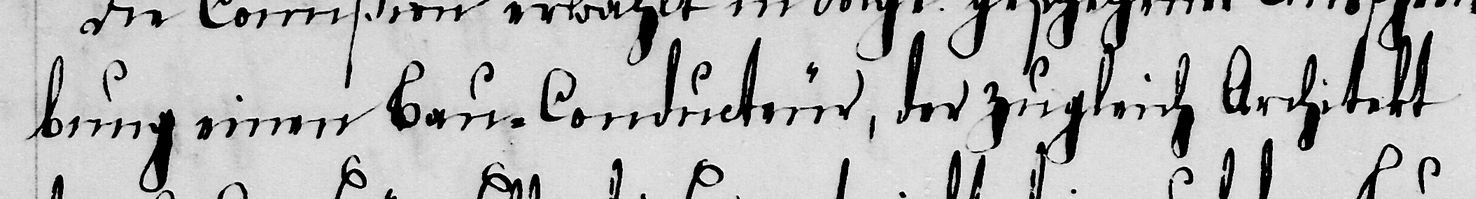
bung einen Bau-Conducteur, der zugleich Architekt
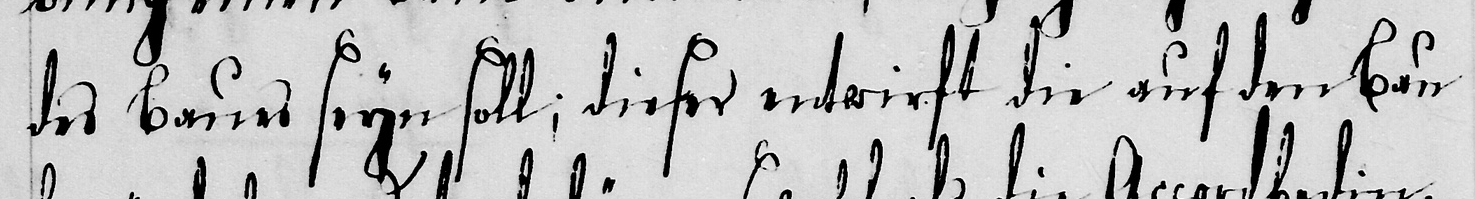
des Baues seyn soll; dieser entwirft die auf den Bau
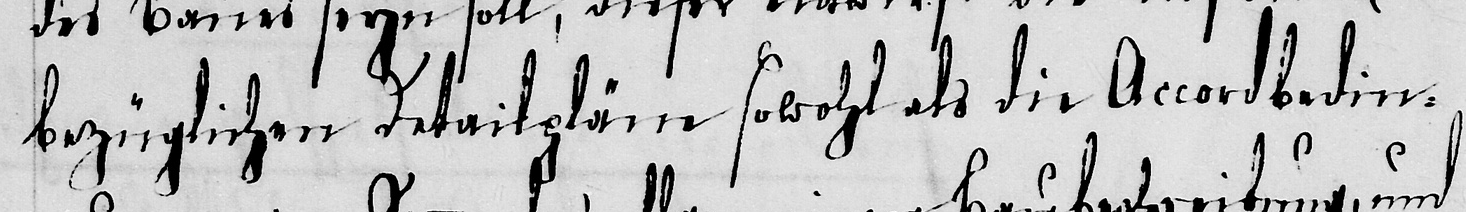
bezüglichen Detailpläne sowohl als die Accordbedin¬
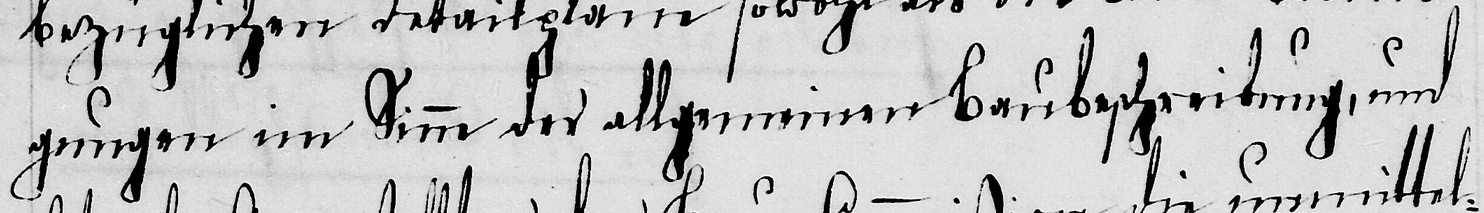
gungen im Sinne der allgemeinen Baubeschreibung, und
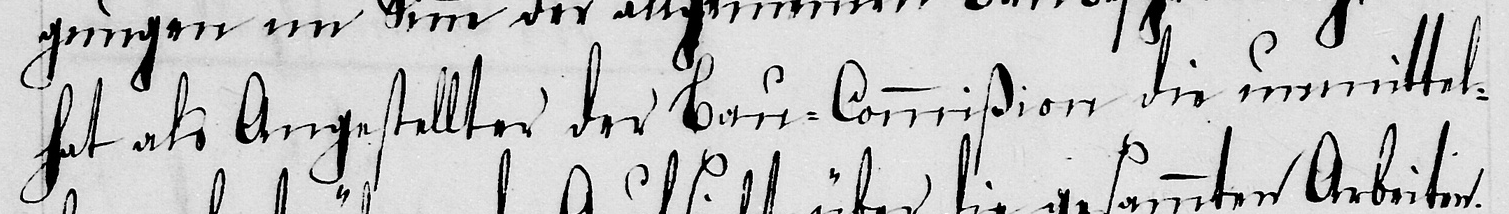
hat als Angestellter der Bau-Commißion die unmittel¬
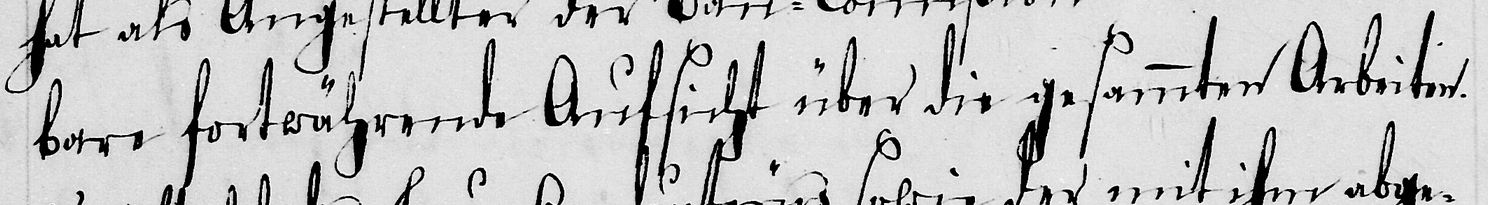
bare fortwährende Aufsicht über die gesammten Arbei¬
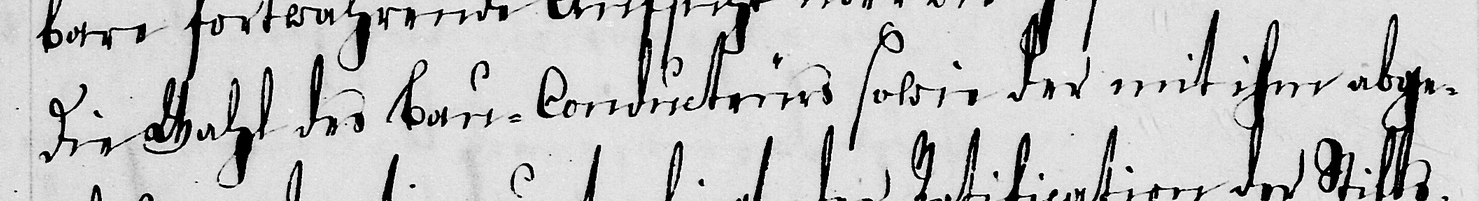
Die Wahl des Bau-Conducteurs sowie der mit ihm abge¬
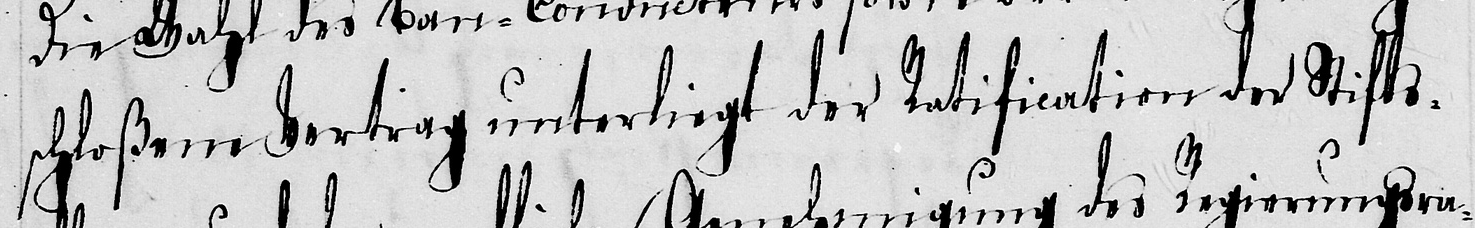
schloßene Vertrag unterliegt der Ratification der Stifts¬
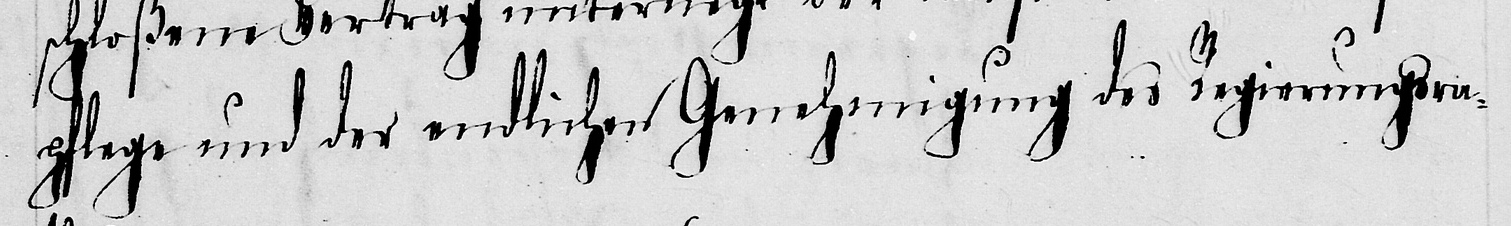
pflege und der endlichen Genehmigung des Regierungsra¬
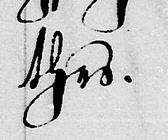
thes.
